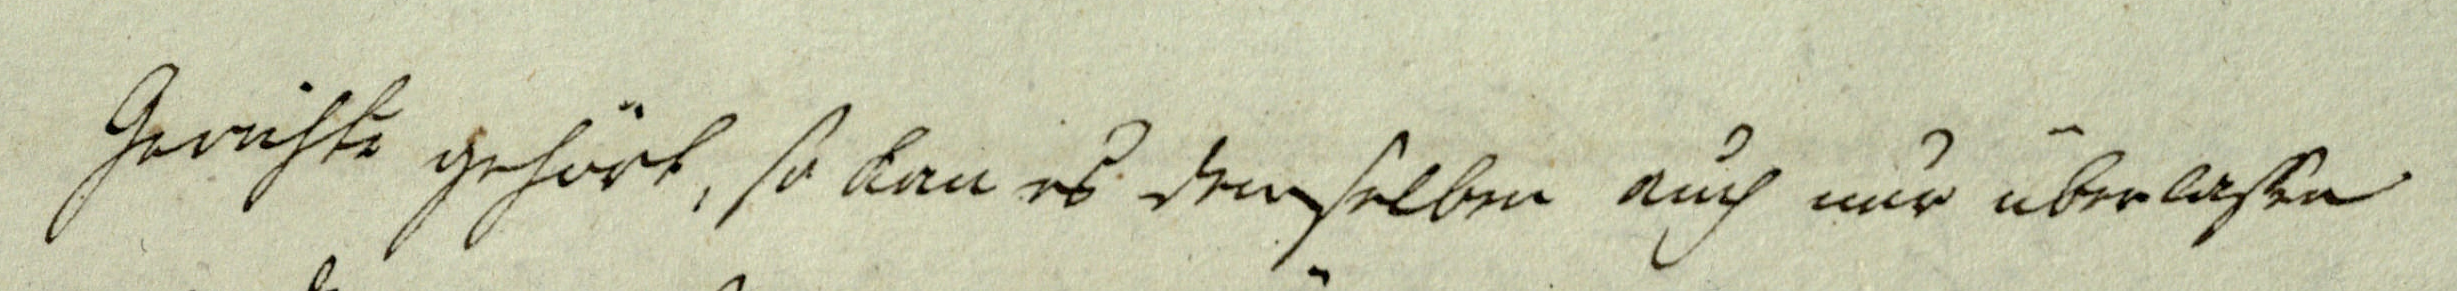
Gerichte gehört, so kan es demselben auch nur überlassen
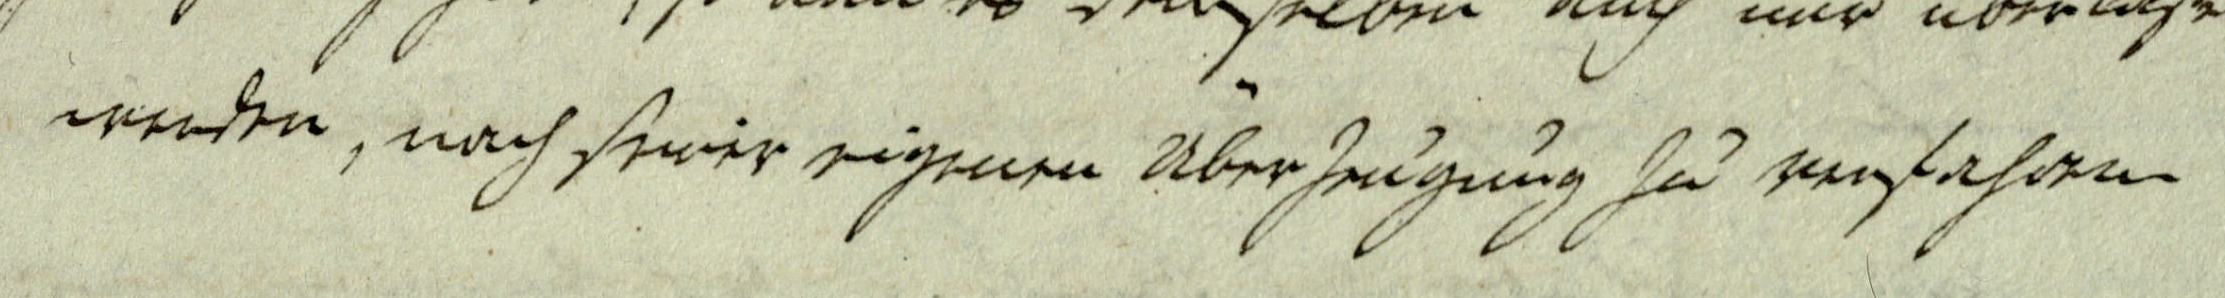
werden, nach seiner eigenen Überzeugung zu verfahren.
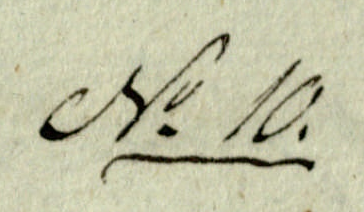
No 10.
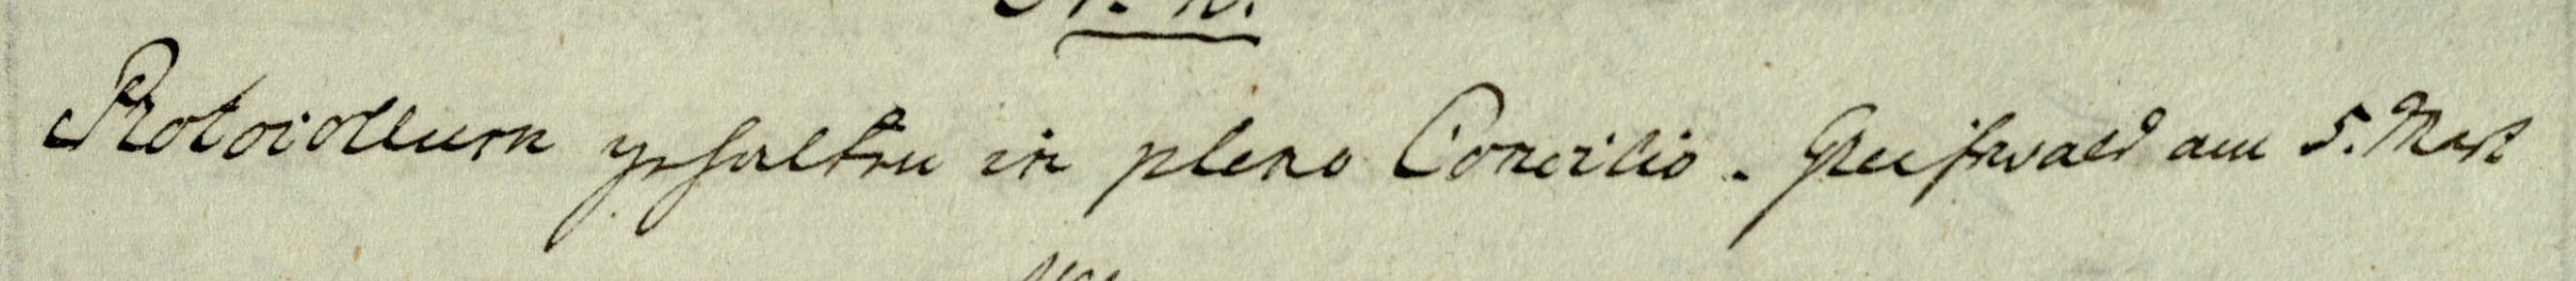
Protocollum gehalten in pleno Concilio. Greifswald am 5. Mart
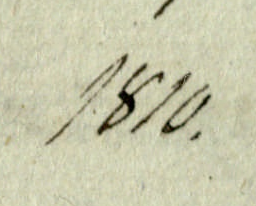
1810.
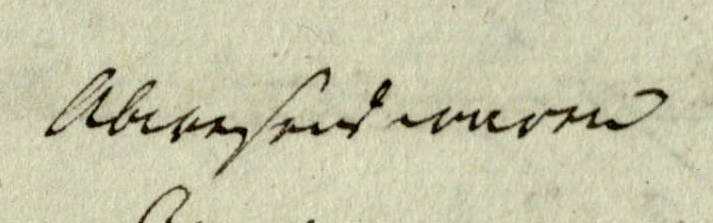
Abwesend waren
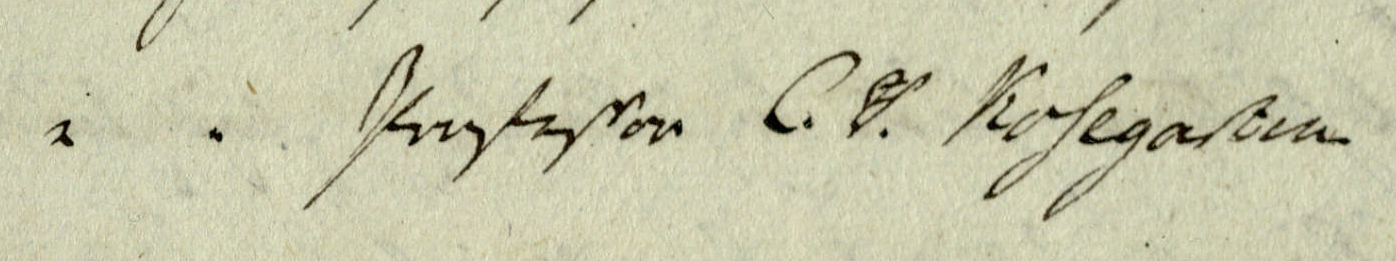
Professor C. R. Kosegarten
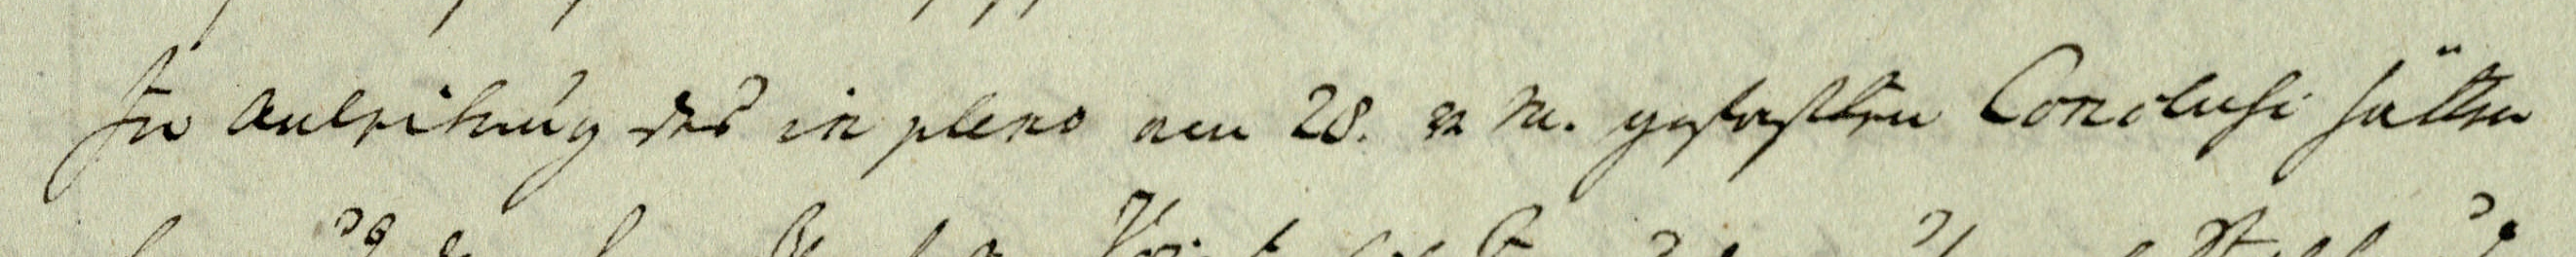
In Anleitung des in pleno am 28. v. M. gefaßten Conclusi hätten
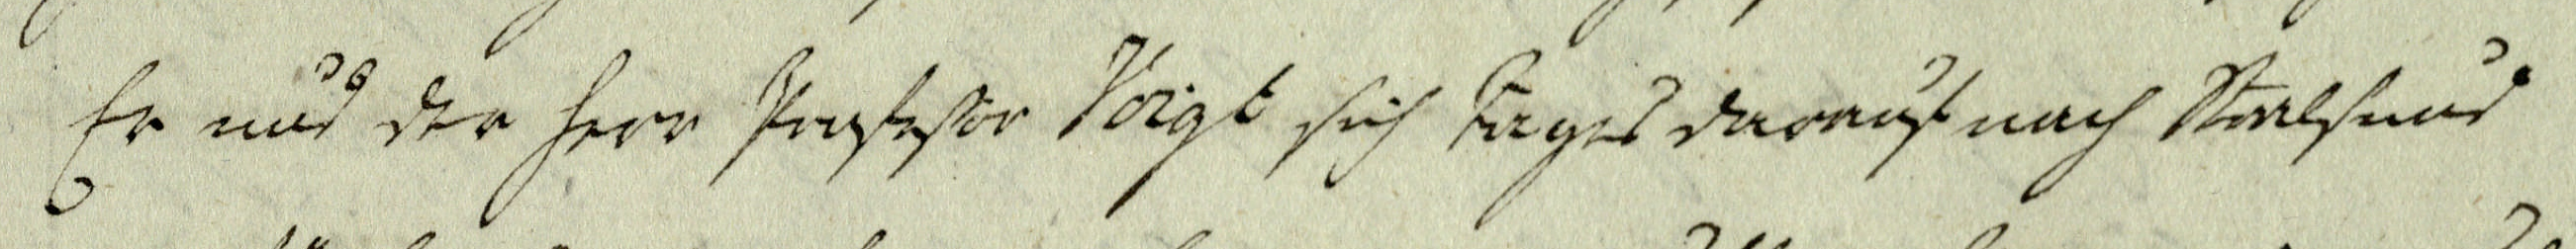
Er und der Herr Professor Voigt sich Tages darauf nach Stralsund
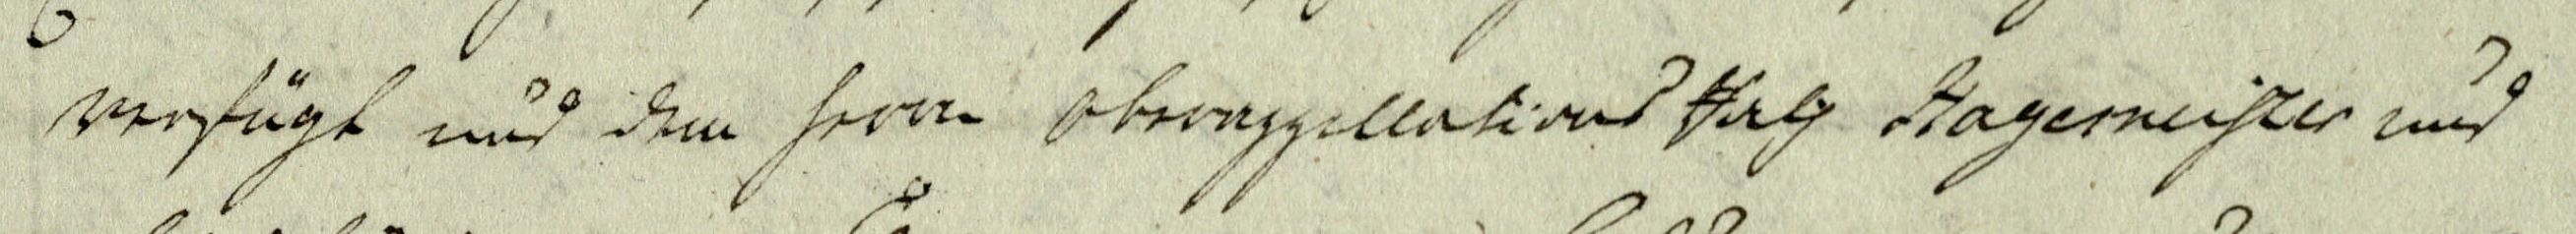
verfügt und dem Herrn Oberappellations Rath Hagemeister und
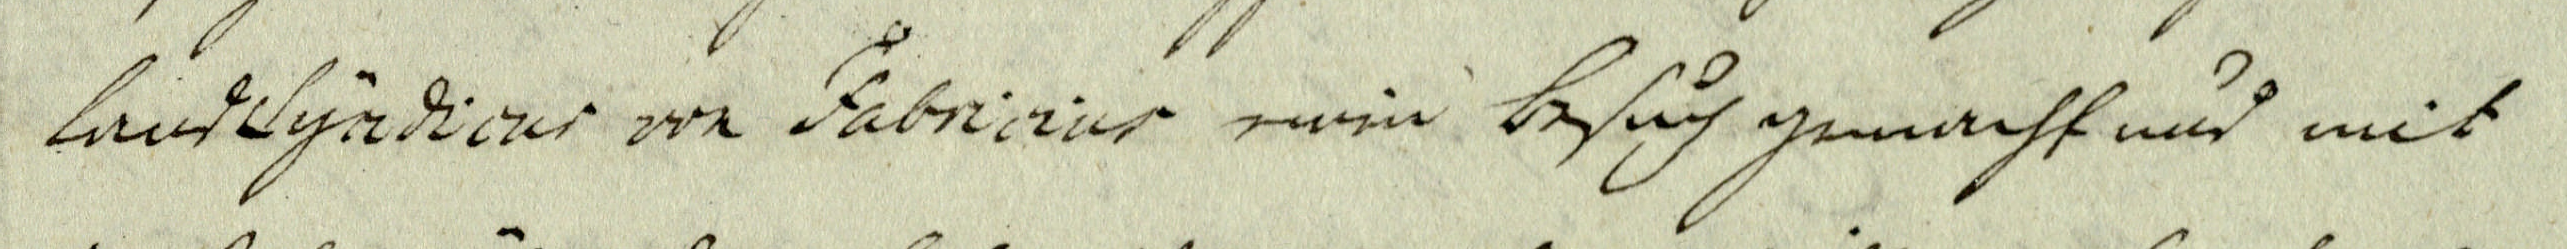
LandSÿndicus von Fabricius einen Besuch gemacht und mit
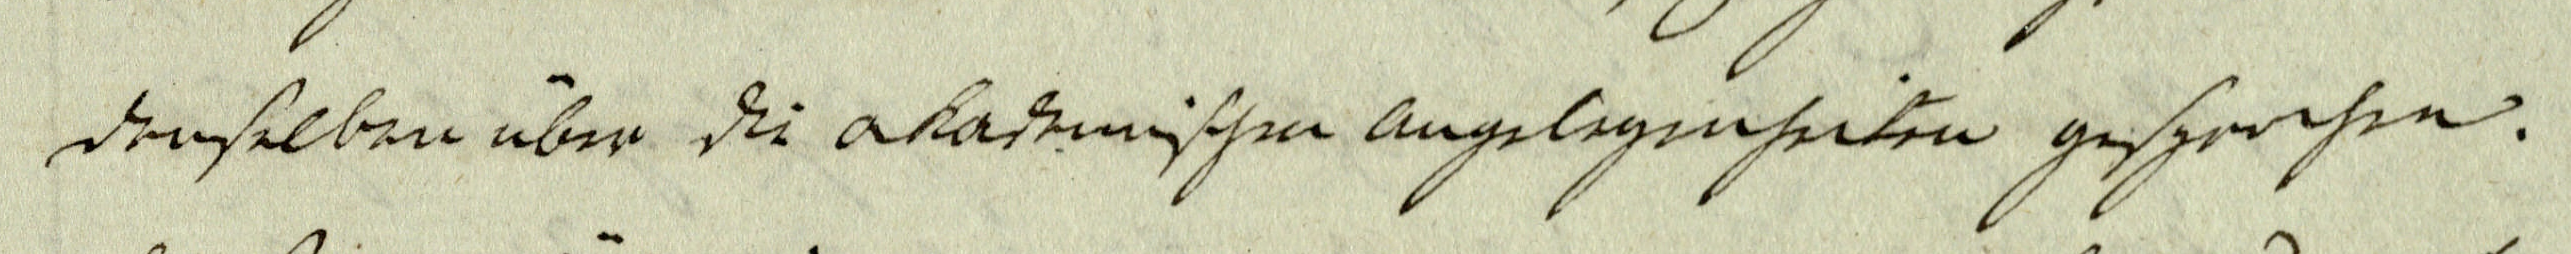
denselben über die akademischen Angelegenheiten gesprochen.
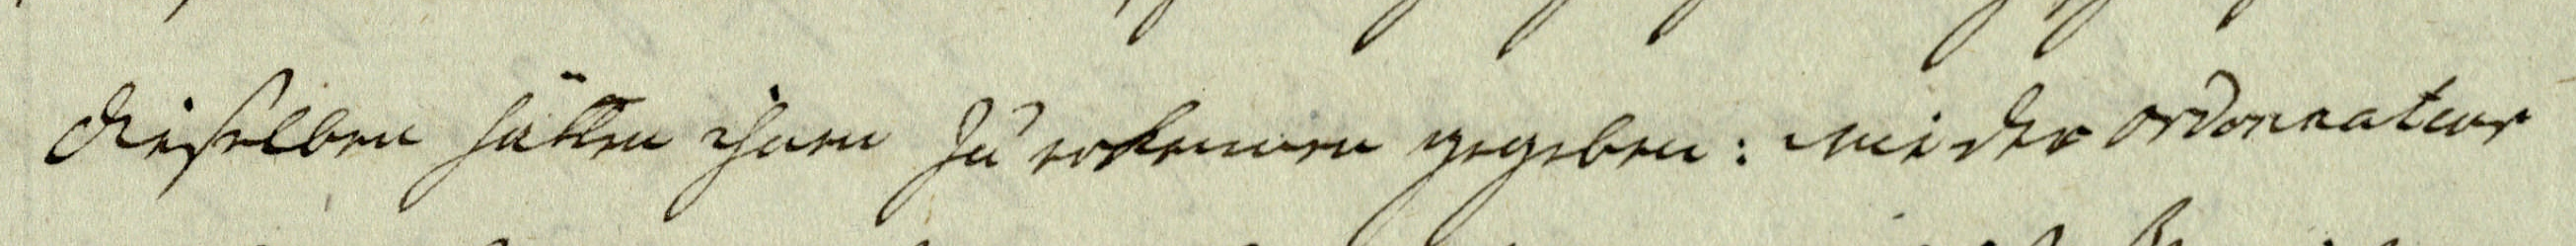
Dieselben hätten ihnen zu erkennen gegeben: wie der Ordonnateur
